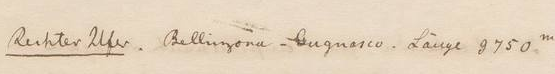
Rechtes Ufer: Bellinzona–Gugnasco. Länge 9750m
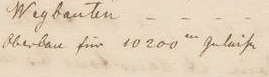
Mehrkosten für das rechte
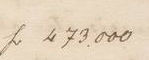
fr 473.000
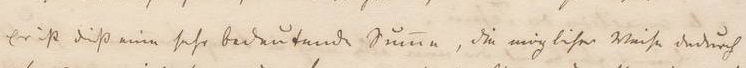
Es ist dieß eine sehr bedeutende Summe, die möglicher Weise dadurch
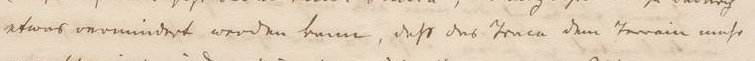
etwas vermindert werden kann, daß das Trace dem Terrain mehr
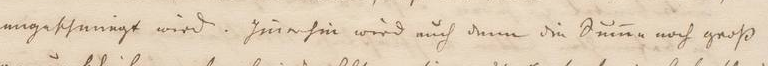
angeschmiegt wird. Immerhin wird auch dann die Summe noch groß
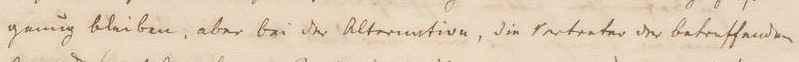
genug bleiben, aber bei der Alternative, die Vertreter der betreffenden
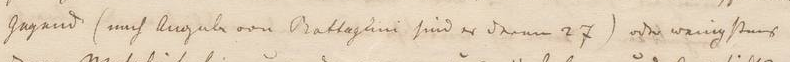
Gegend (nach Angabe von Battaglini sind es deren 27) oder weinigstens
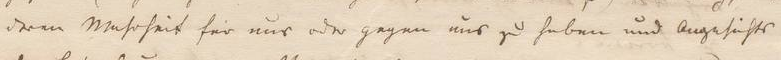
deren Mehrheit für uns oder gegen uns zu haben und Angesichts
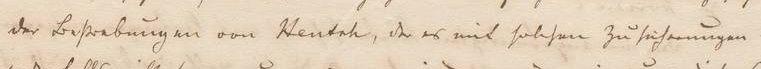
der Bestrebungen von Hentsch, der es mit solchen Zusicherungen
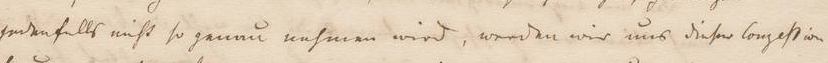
jedenfalls nicht so genau nehmen wird, werden wir uns dieser Conzession
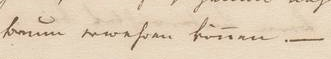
kaum erwehren können. –
